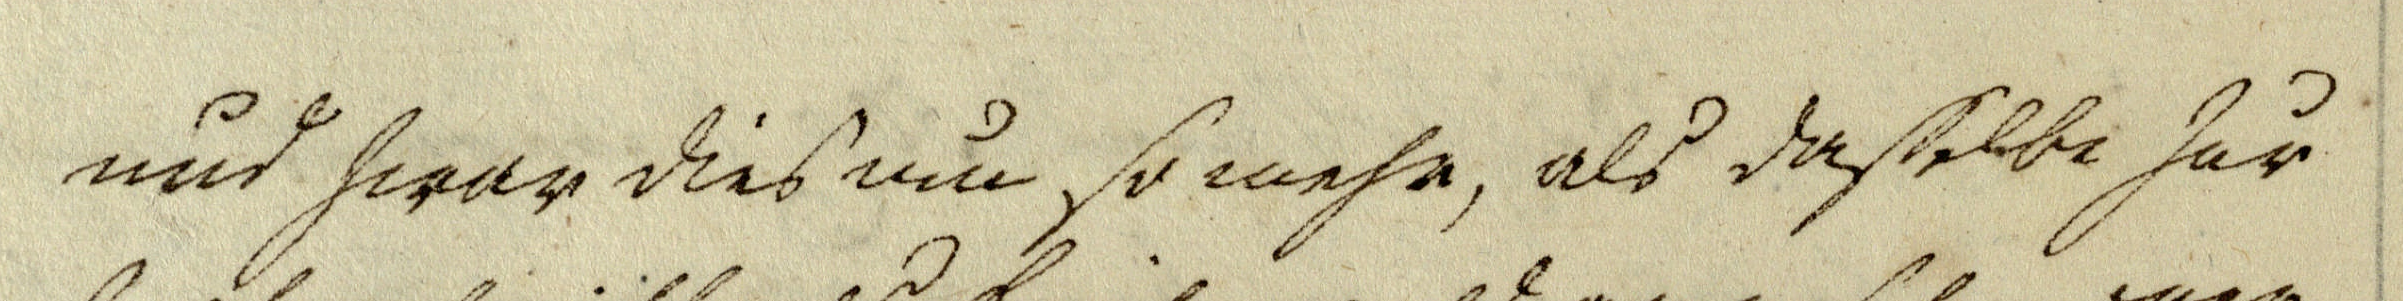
und zwar dies um so mehr, als dasselbe zur
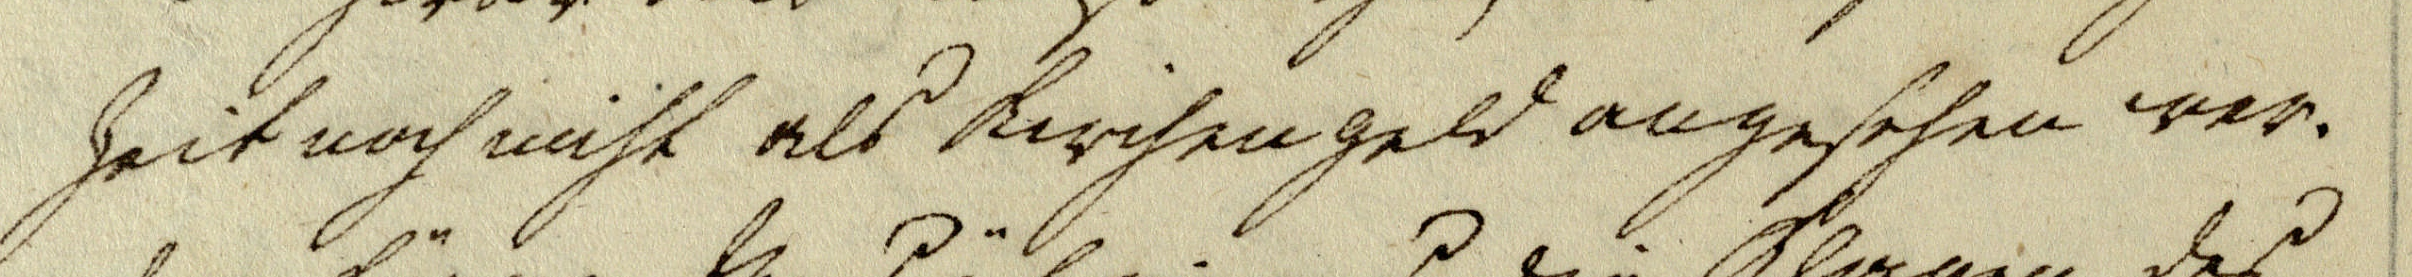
Zeit noch nicht als Kirchengeld angesehen wer¬
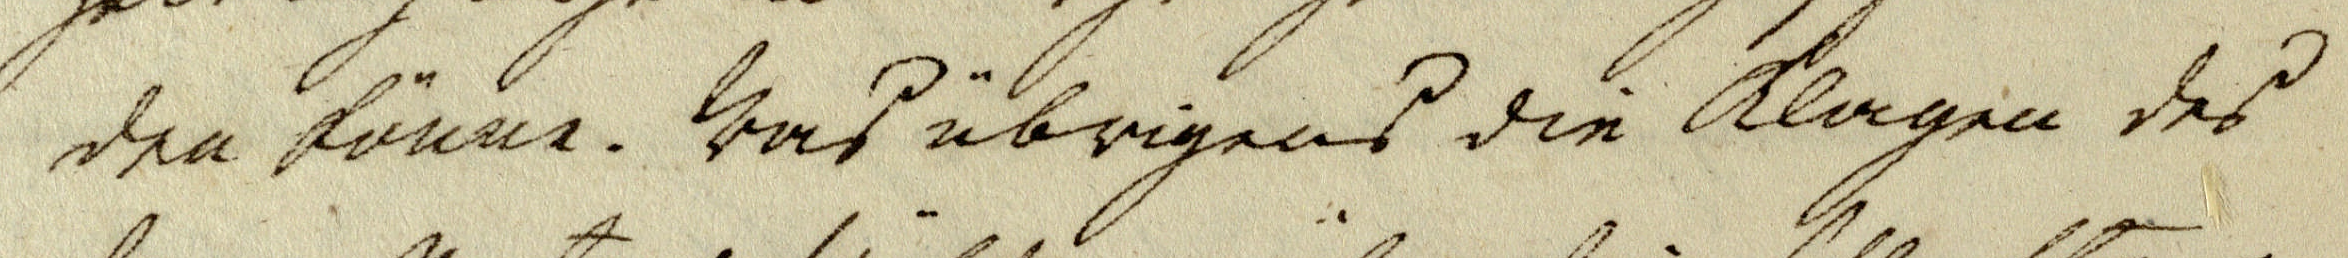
den könne. Was übrigens die Klagen des
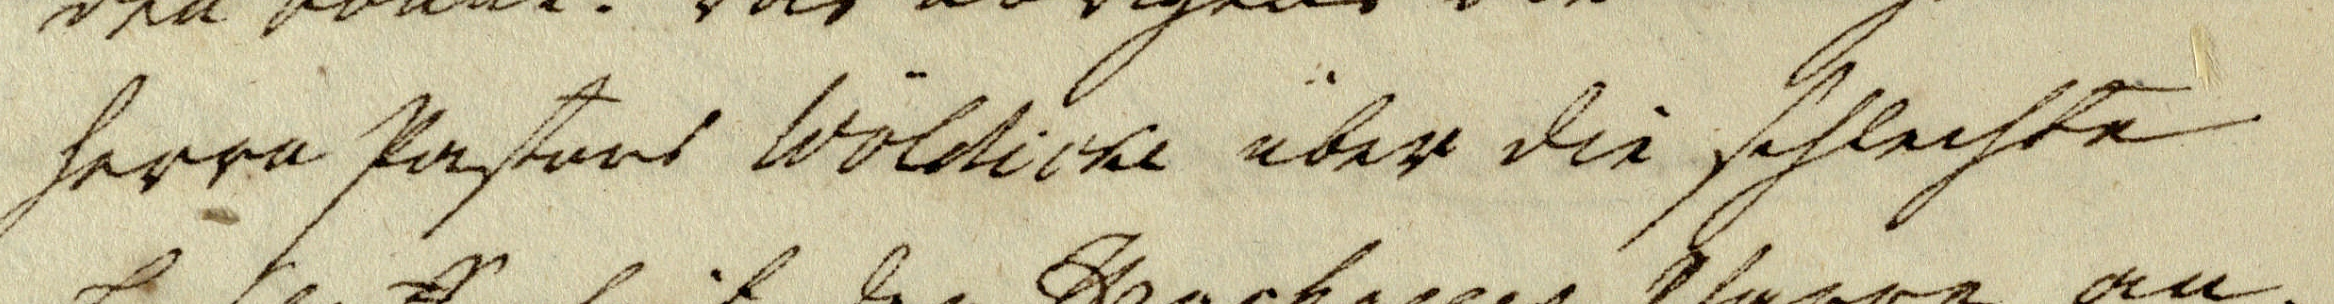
Herrn Pastors Wöldicke über die schlechte
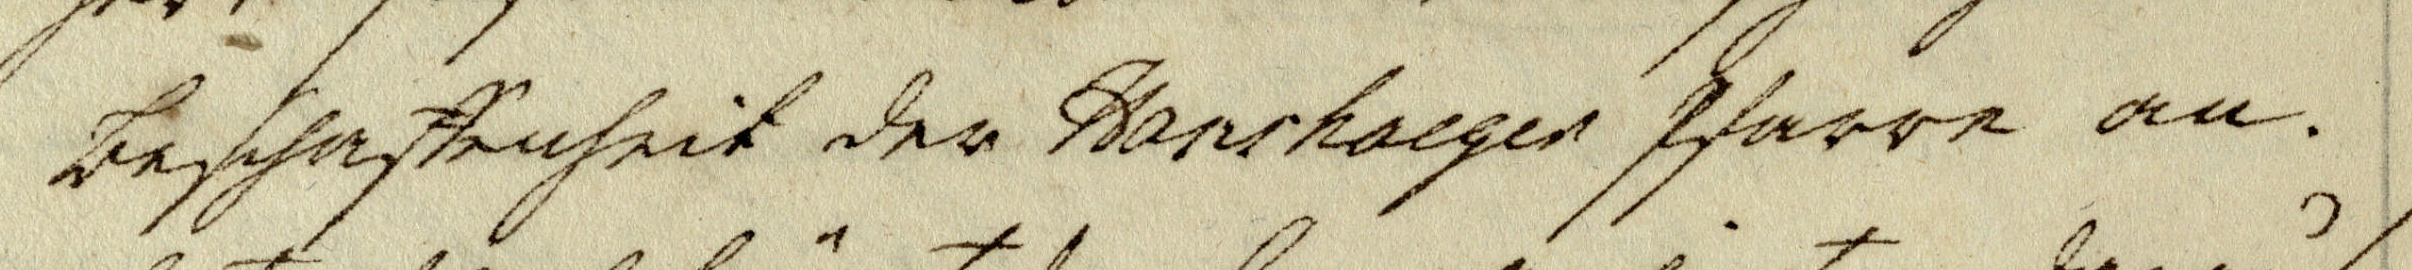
Beschaffenheit der Hanshaeger Pfarre an¬
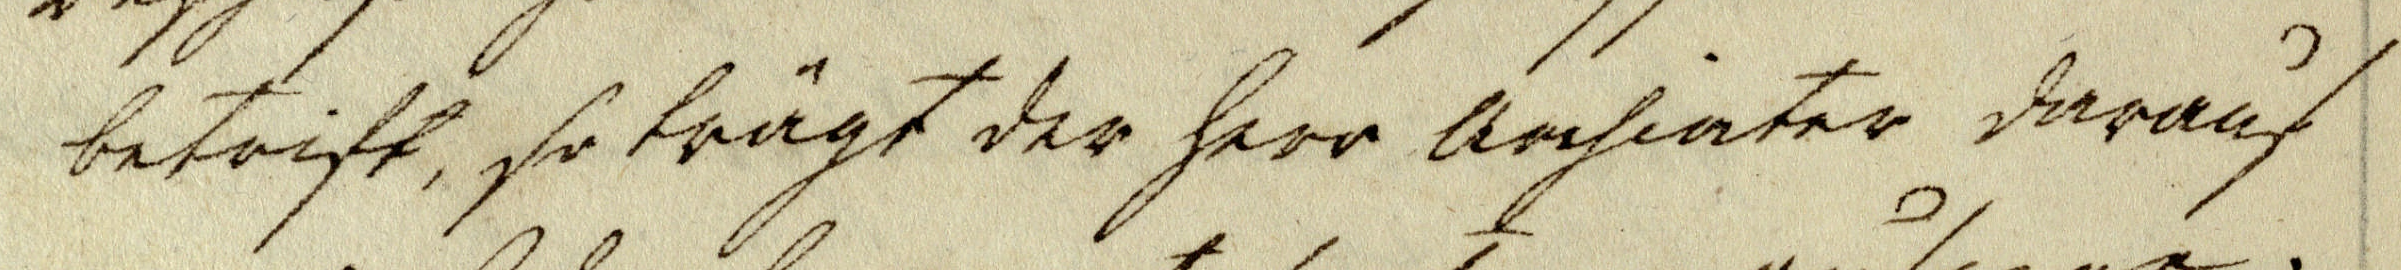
betrift, so trägt der Herr Archiater darauf
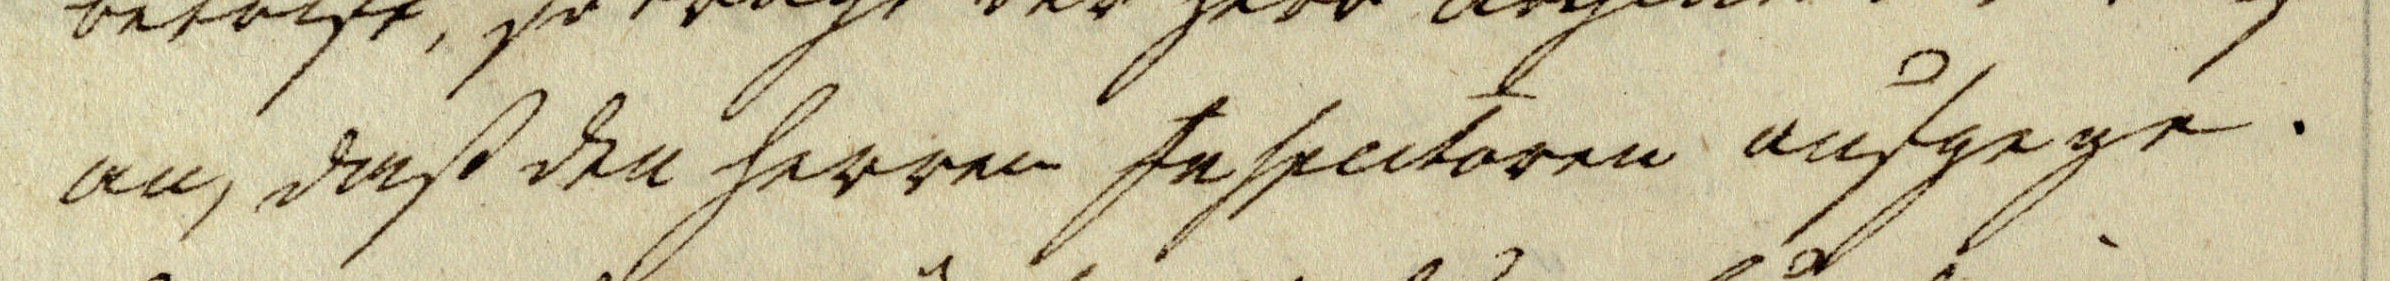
an, daß den Herren Inspectoren aufgege¬
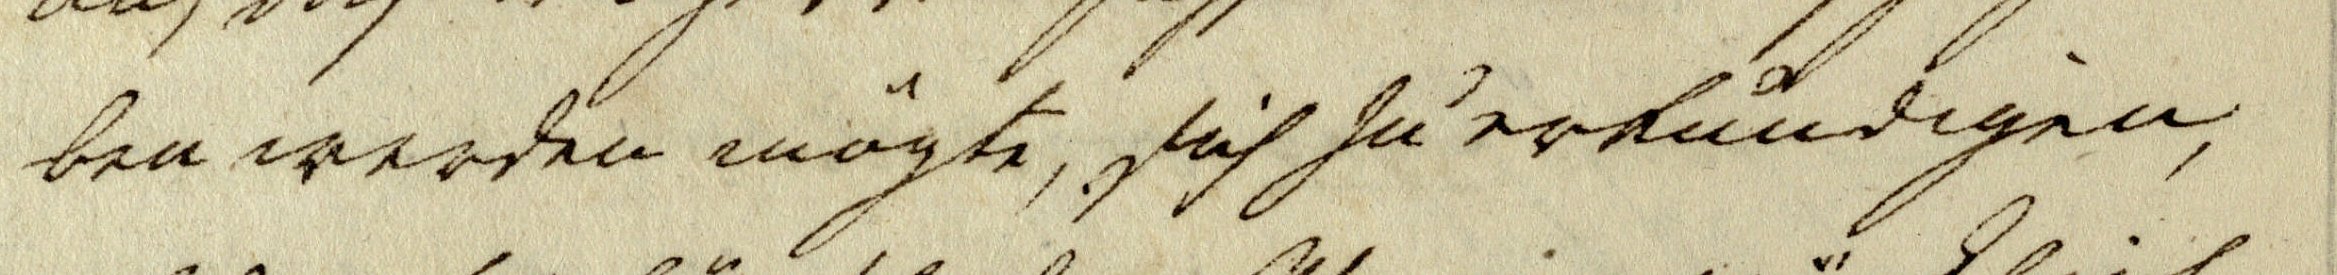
ben werden mögte, sich zu erkundigen,
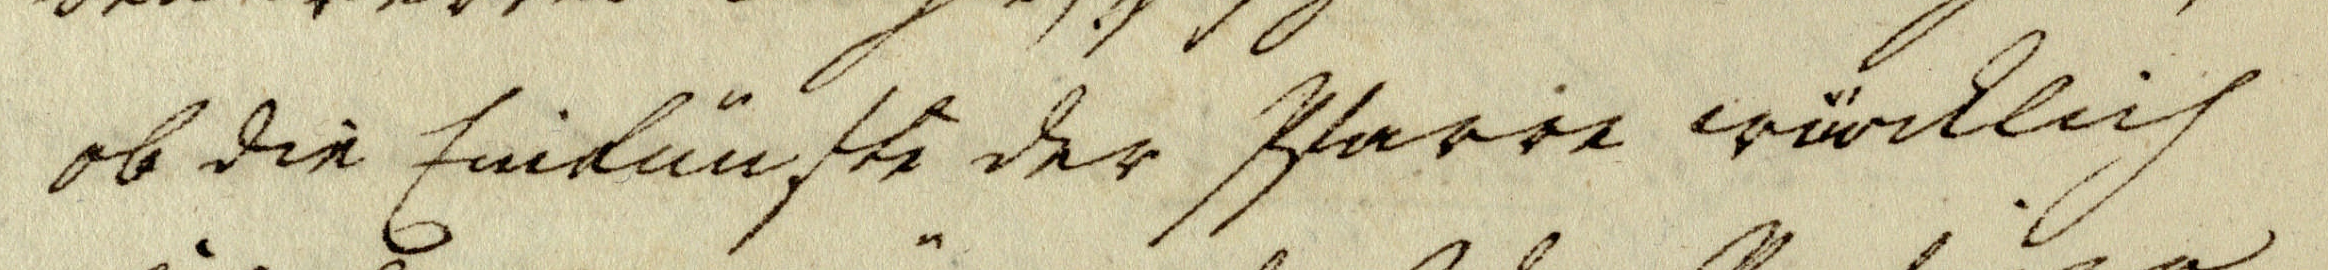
ob die Einkünfte der Pfarre würcklich
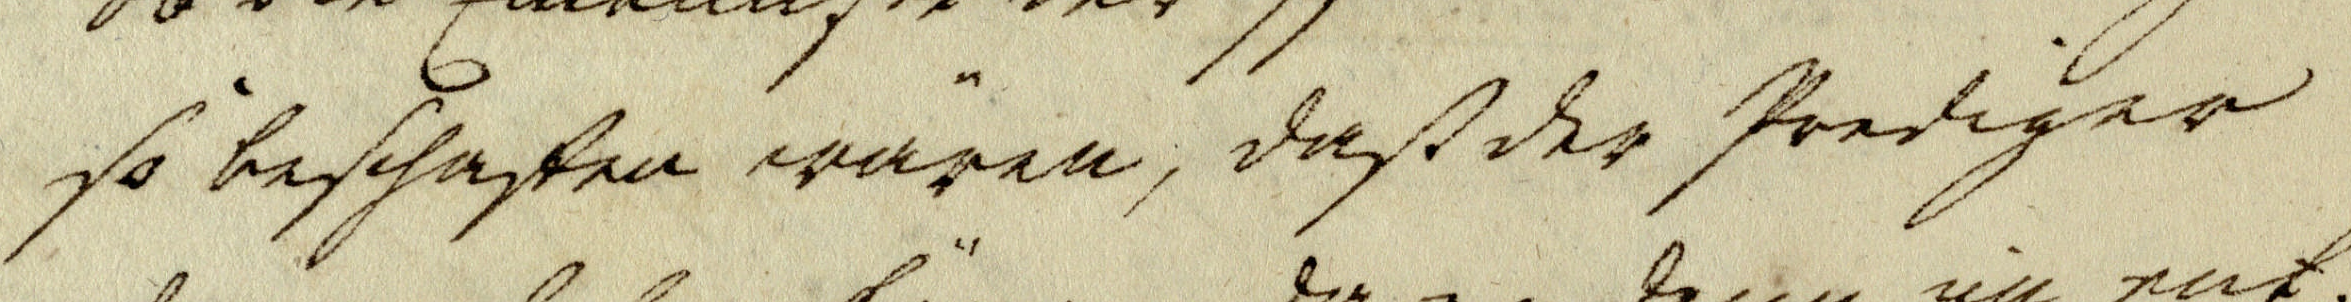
so beschaffen wären, daß der Prediger
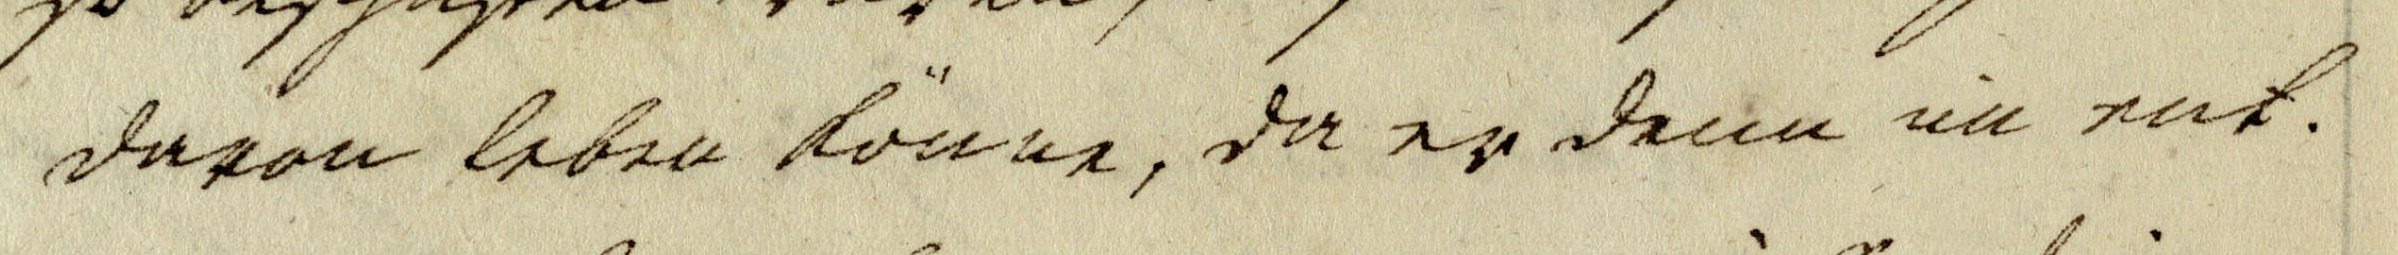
davon leben könne, da er denn im ent¬
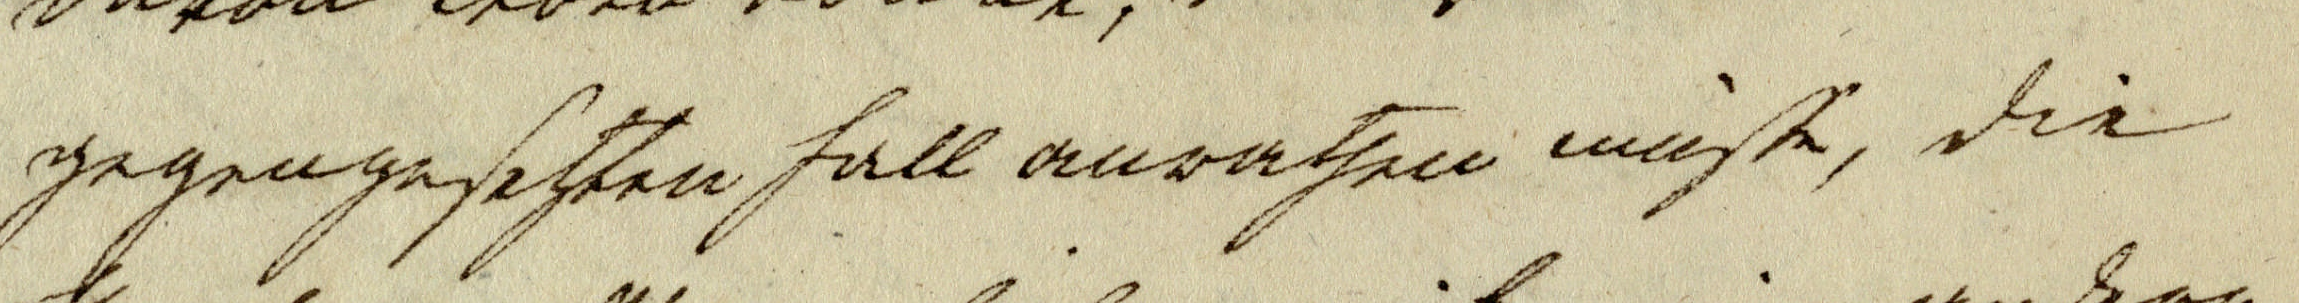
gegengesetzten Fall anrathen müsse, die
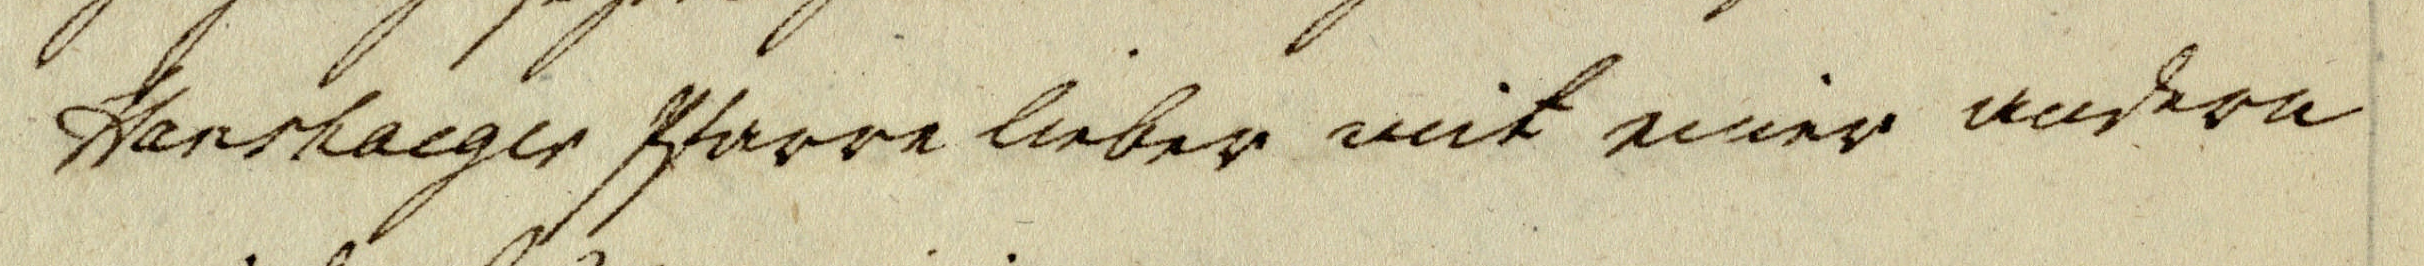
Hanshaeger Pfarre lieber mit einer andern
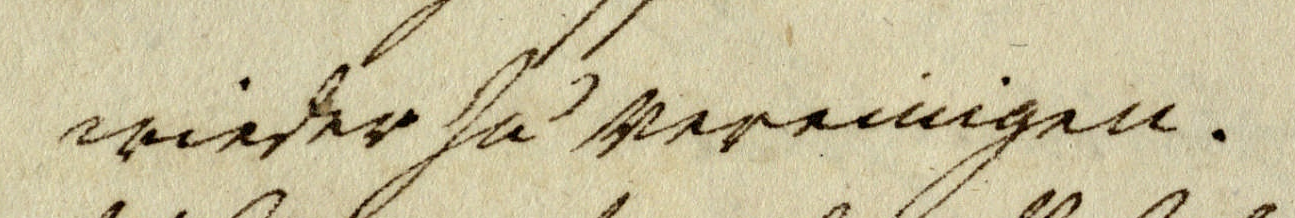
wieder zu vereinigen
